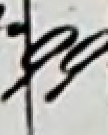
99
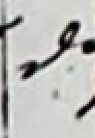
do
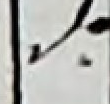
do
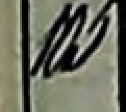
105
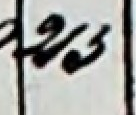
213
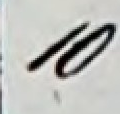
10
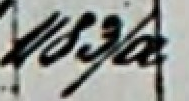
1183/a
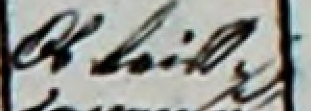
OB tritt
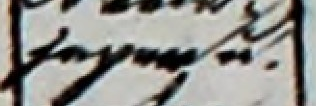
ingung u.
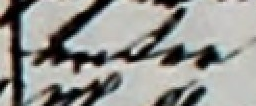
An der
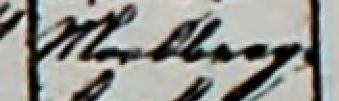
Moosberg
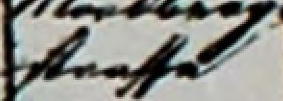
st?asse
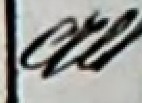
Alt
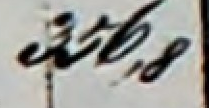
356,8
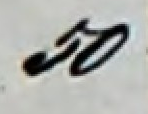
50
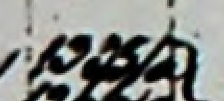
1335/a
